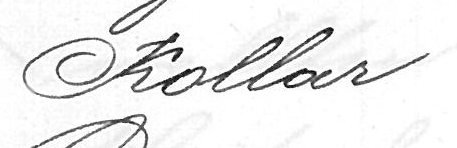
Kollar
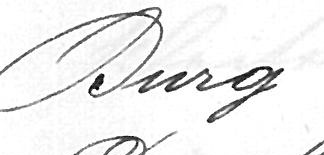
Burg
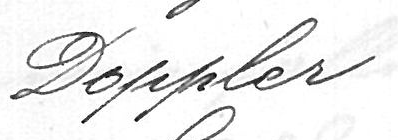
Doppler
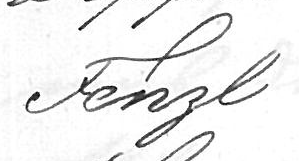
Fenzl
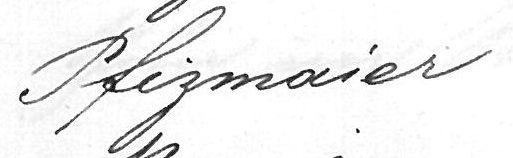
Pfizmaier
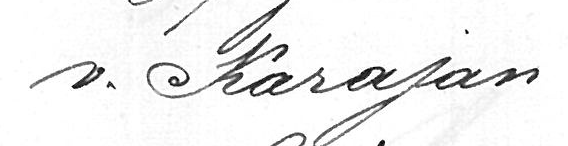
v. Karajan
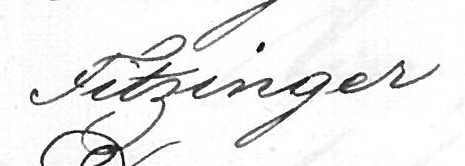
Fitzinger
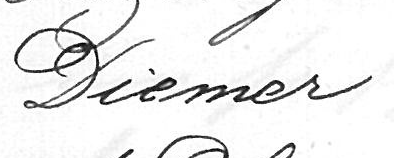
Diemer
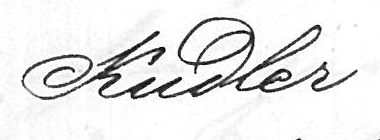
Kudler
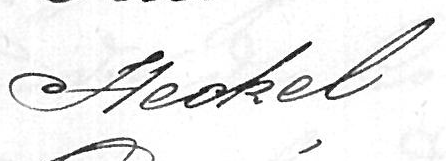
Heckel
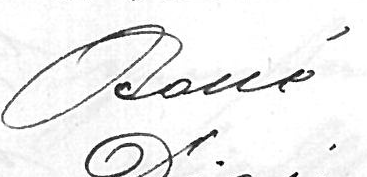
Boué
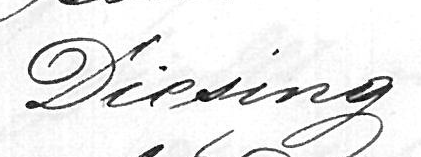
Diesing
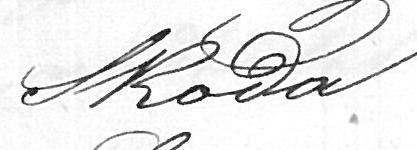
Skoda
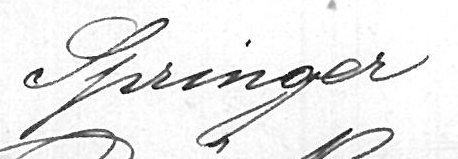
Springer
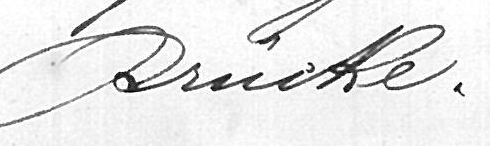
Brücke.
